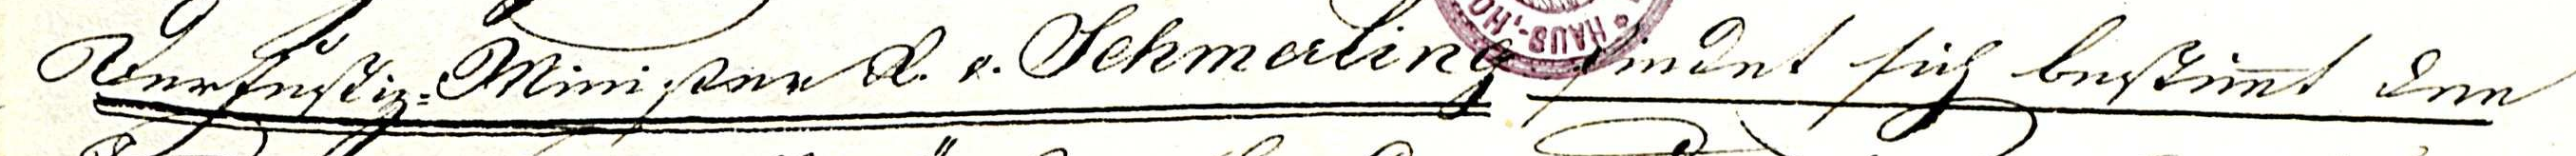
Der Justiz-Minister R. v. Schmerling findet sich bestimmt den
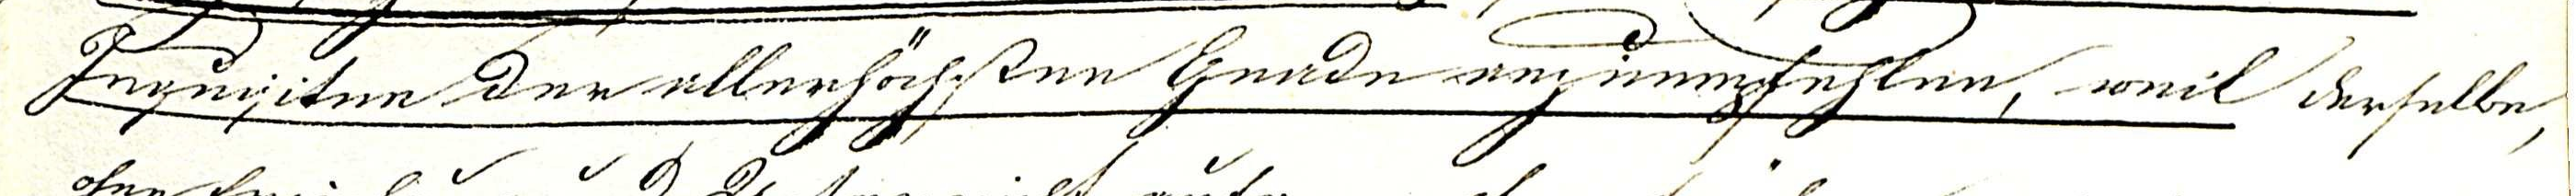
Jnquisiten der allerhöchsten Gnade anzuempfehlen, weil derselbe,
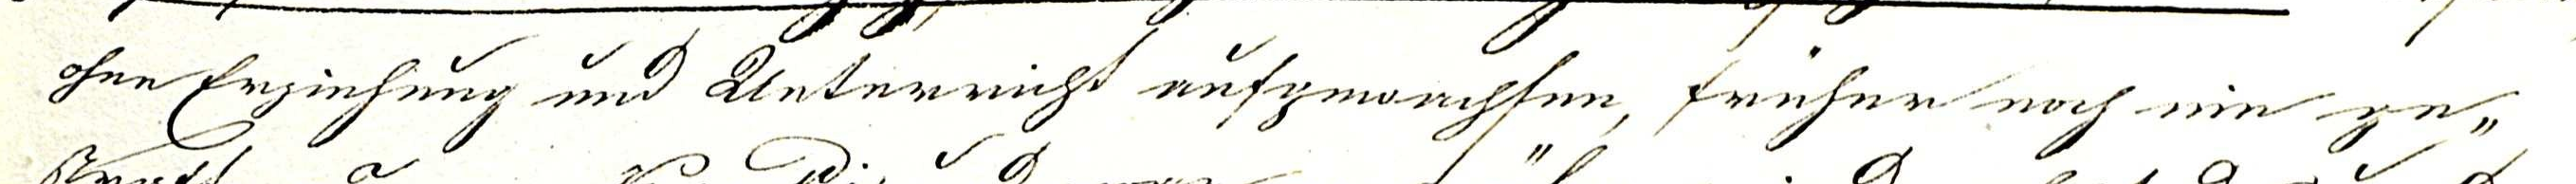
ohne Erziehung und Unterricht aufgewachsen, früher noch ein ge¬
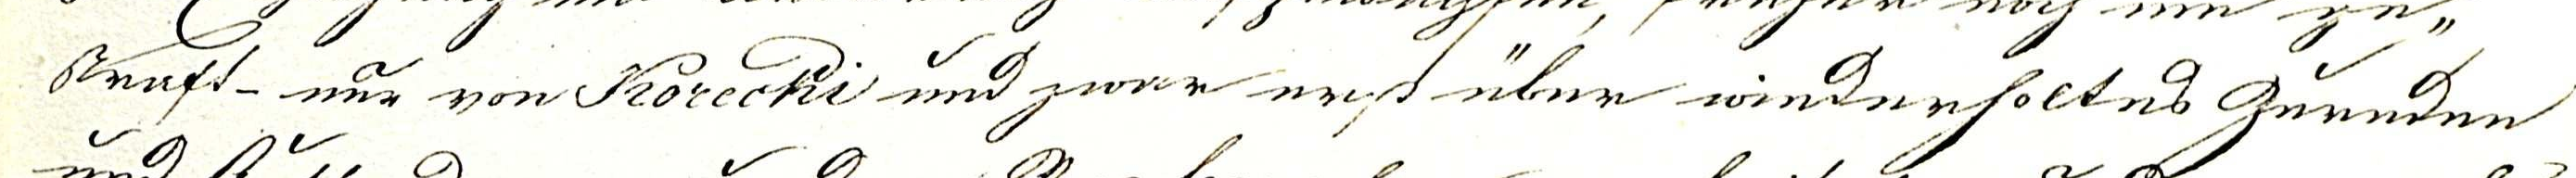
straft_ nur von Korecki und zwar erst über wiederholtes Zureden
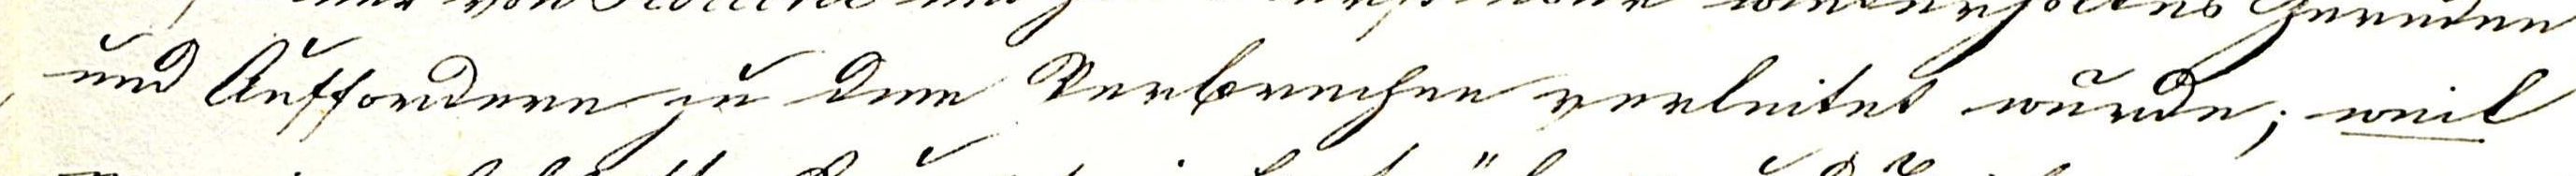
und Auffordere zu dem Verbrechen verleitet wurde; weil
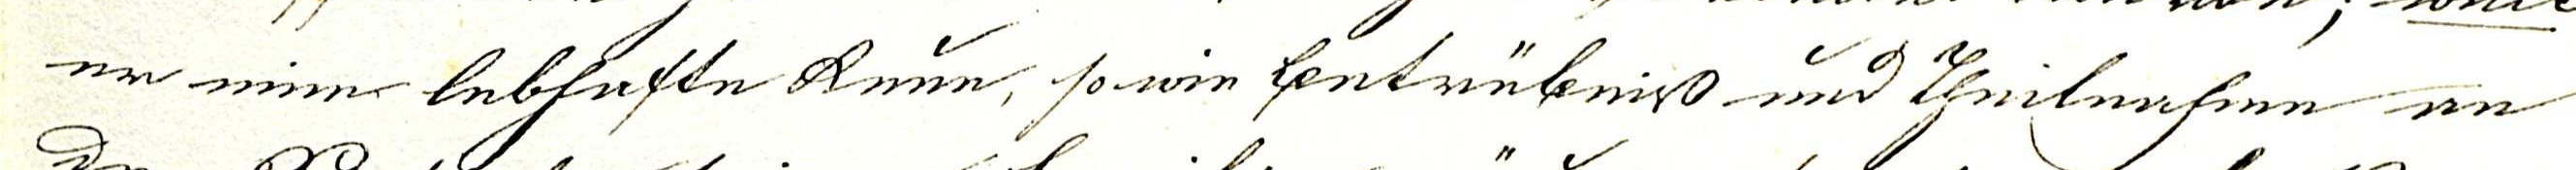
er eine lebhafte Reue, so wie Betrübniß und Theilnahme an
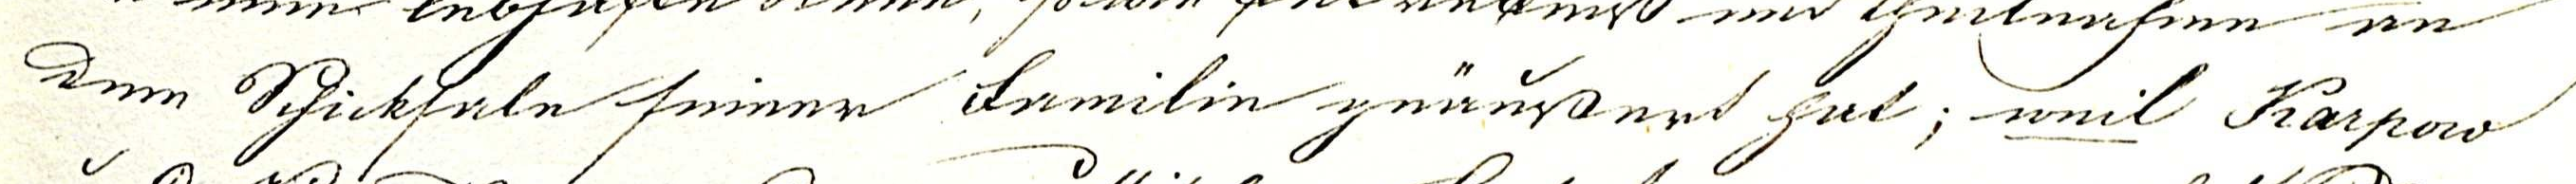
dem Schicksale seiner Familie geäußert hat; weil Karpow
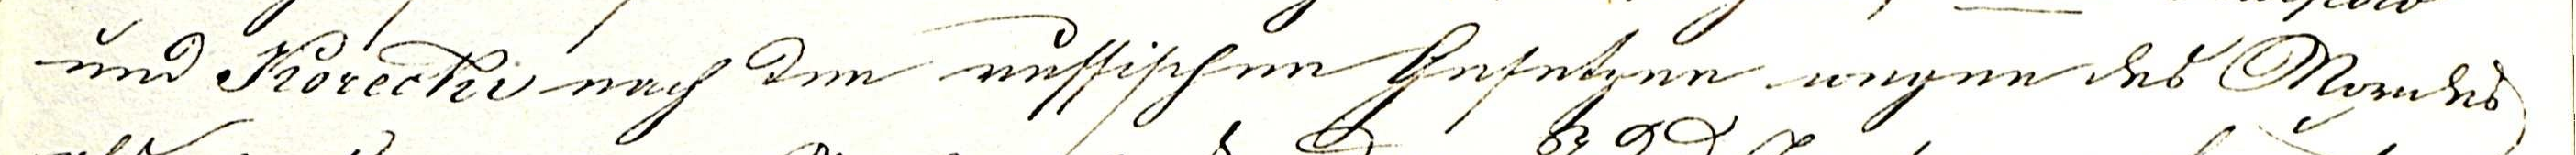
und Korecki nach den russischen Gesetzen wegen des Mordes
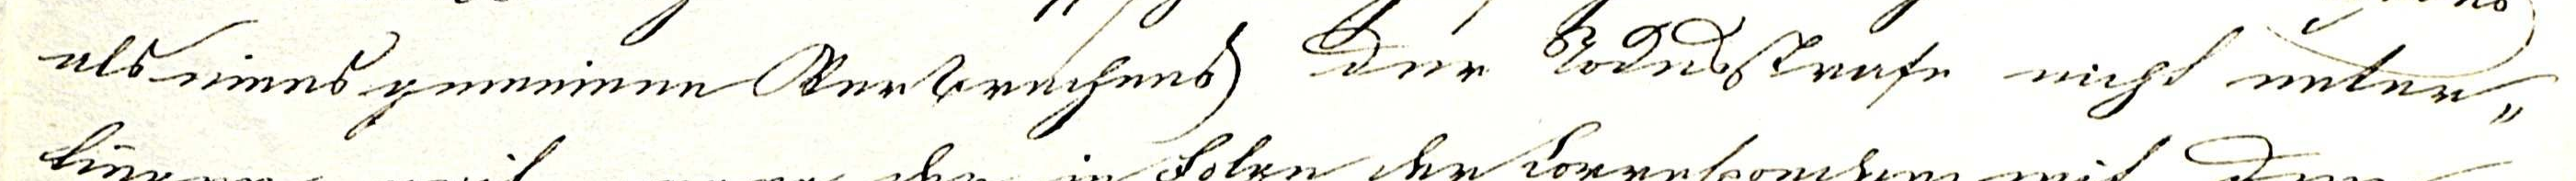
als eines gemeinen Verbrechens der Todesstrafe nicht unter¬
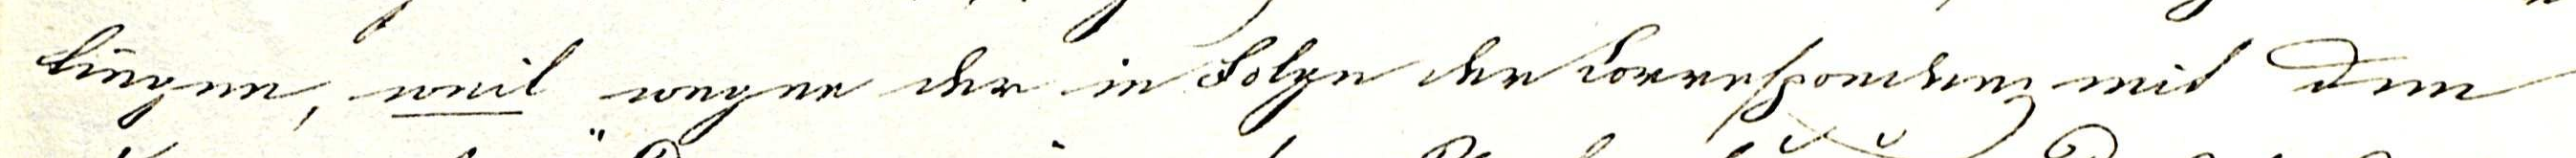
liegen, weil wegen der in Folge der Correspondenz mit den
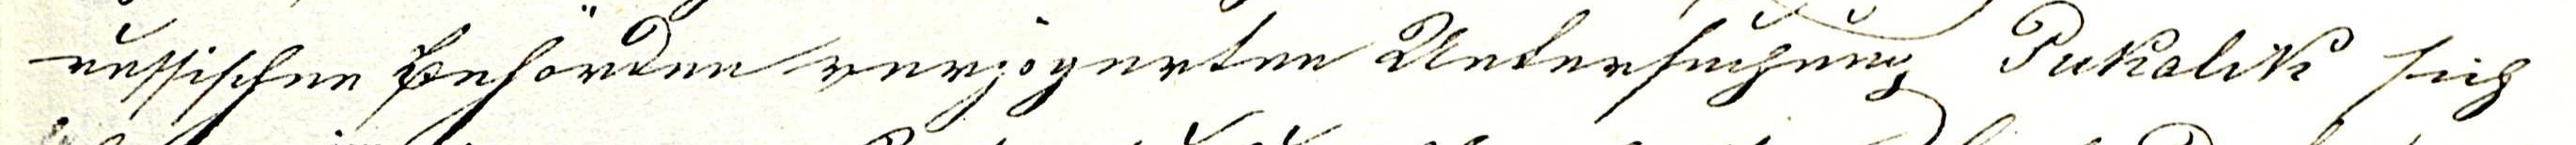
russischen Behörden verzögerten Untersuchung Pukalik sich
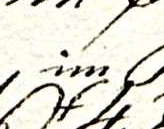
im
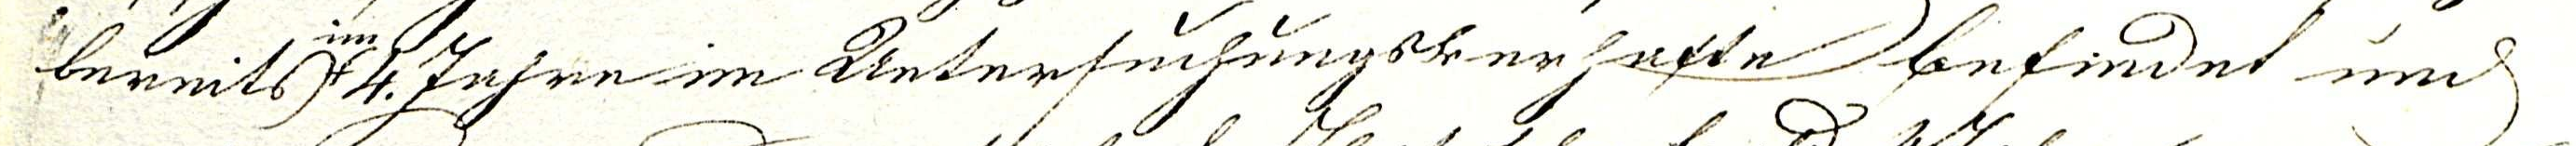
bereits 4. Jahre im Untersuchungsverhafte befindet und
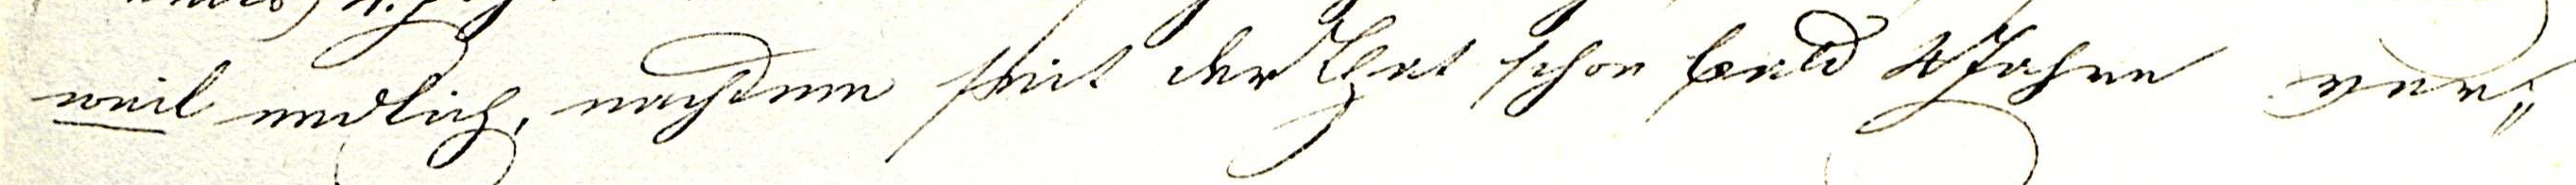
weil endlich, nachdem seit der That schon bald 4 Jahre ver¬
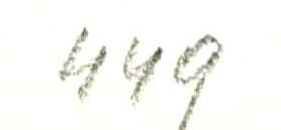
449
